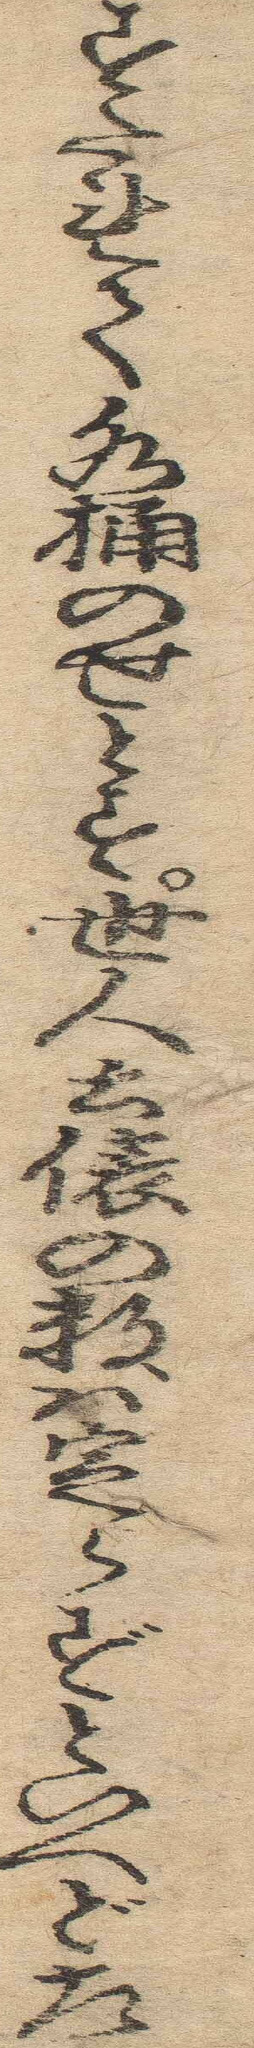すたれて水桶のせとす。世人土俵の数は定らずといへど左
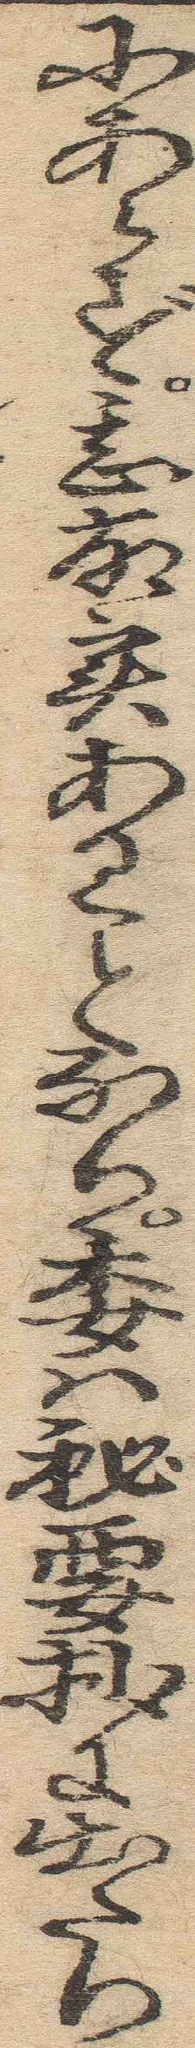にあらず。甚故実あることなり。委は秘要抄に出たり
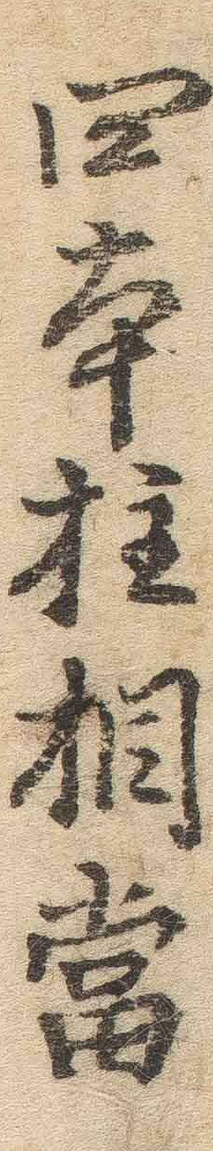四本柱相当
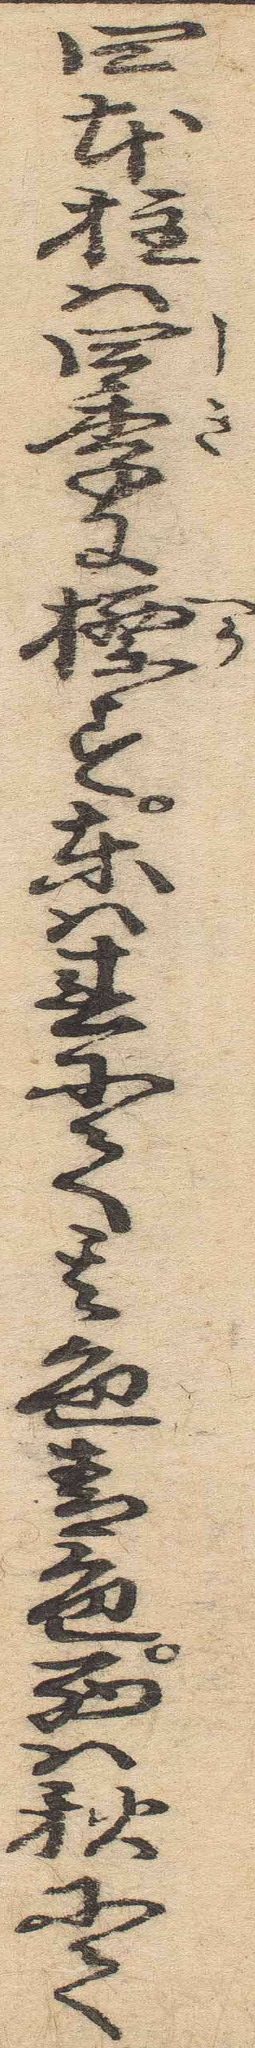四本柱は四季に標す。東は春にて其色青色。西は秋にて
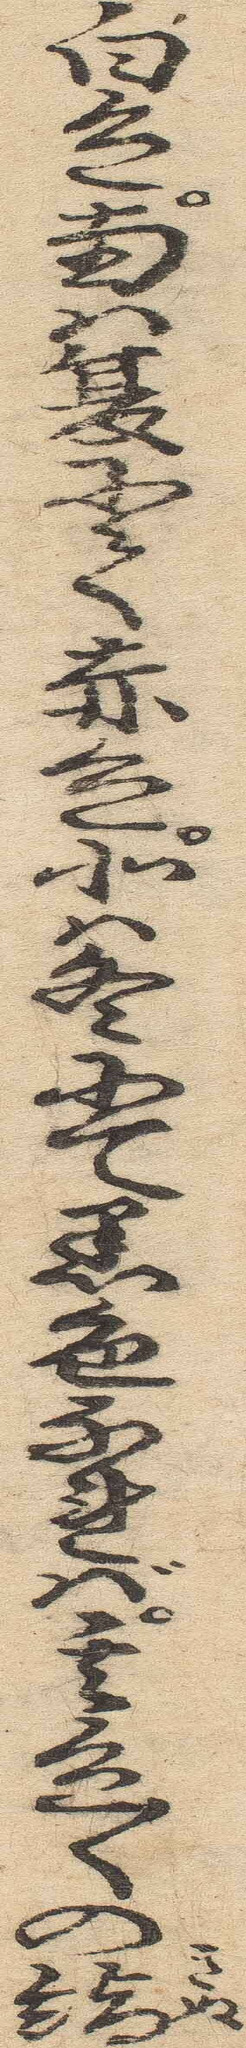白色。南は夏にて赤色。北は冬にて黒色なれば。其色〳〵の絹
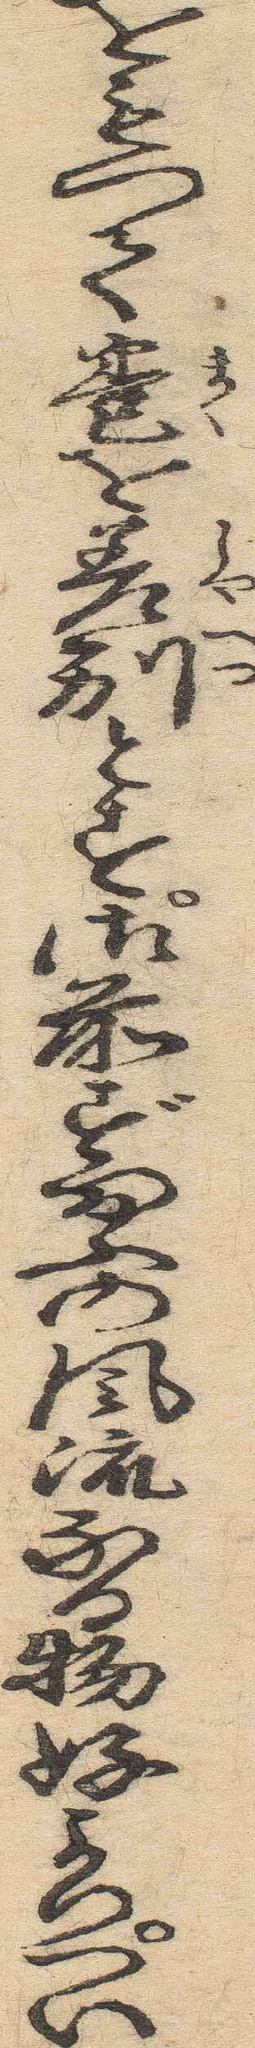をもつて巻を差別とす。御前ずまふの風流なる物好より。つい
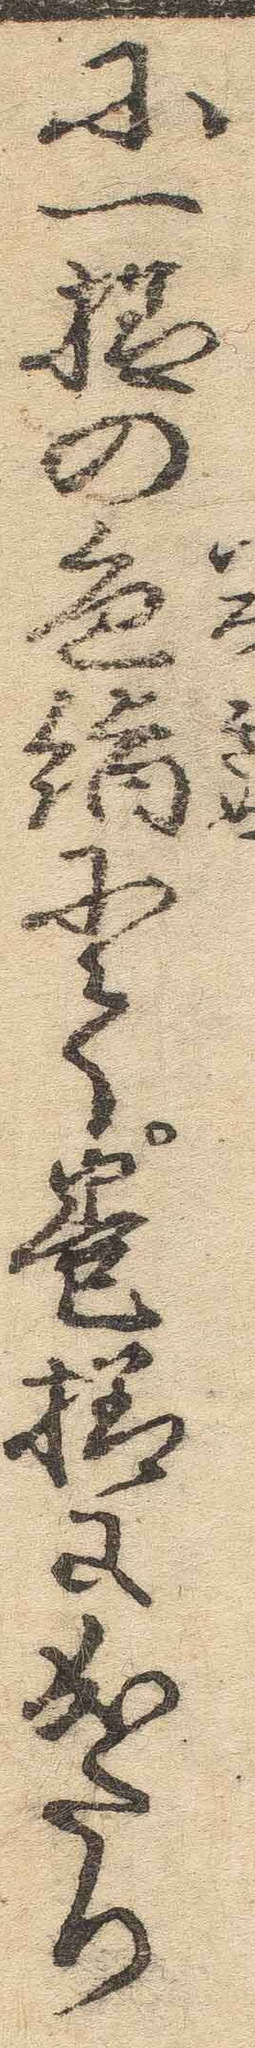に一様の色絹にて。巻様に成たり
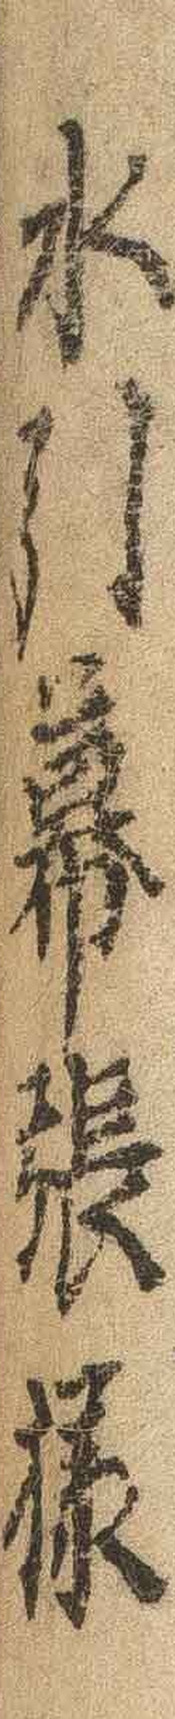水引幕張様
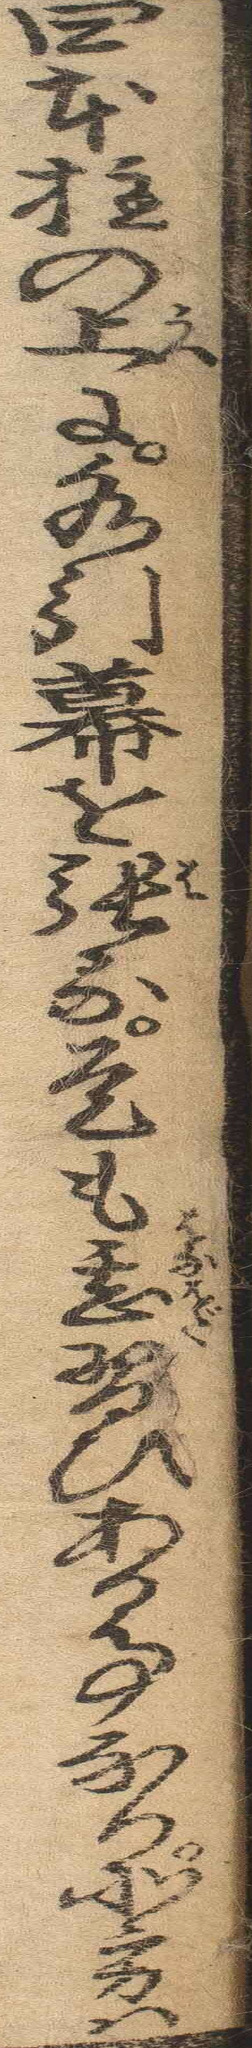四本柱の上に。水引幕を張る。是も甚習ひある事なり。北方は
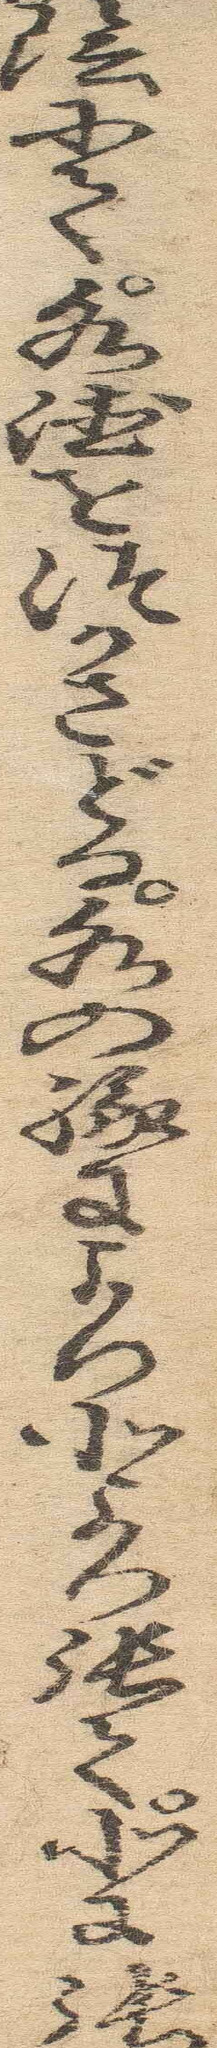陰にて。水徳をつかさどる。水の縁により北より張て。北に張
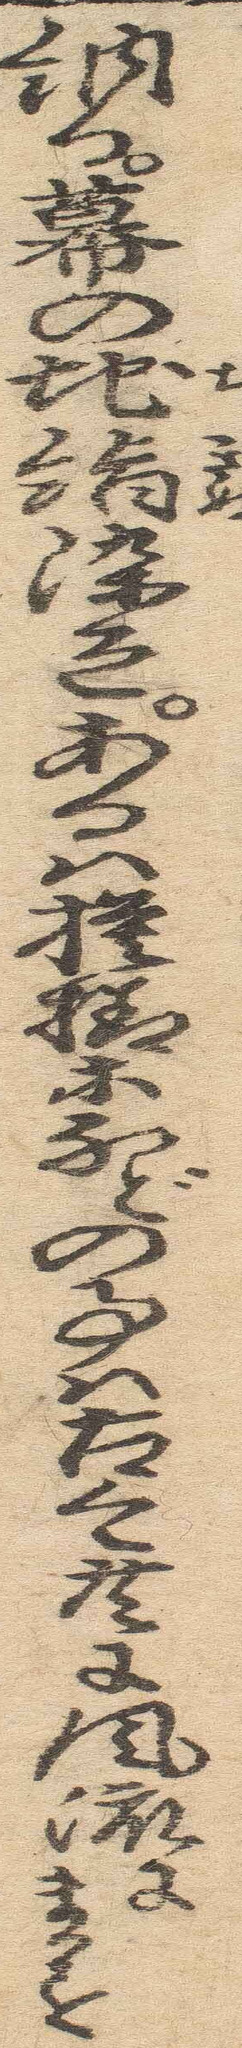納る。幕の地絹染色。あるは模様等などの事は古今共に風流にまかす
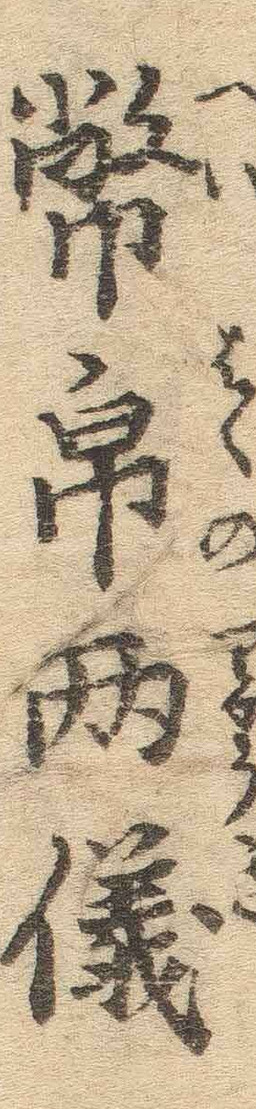幣帛両儀
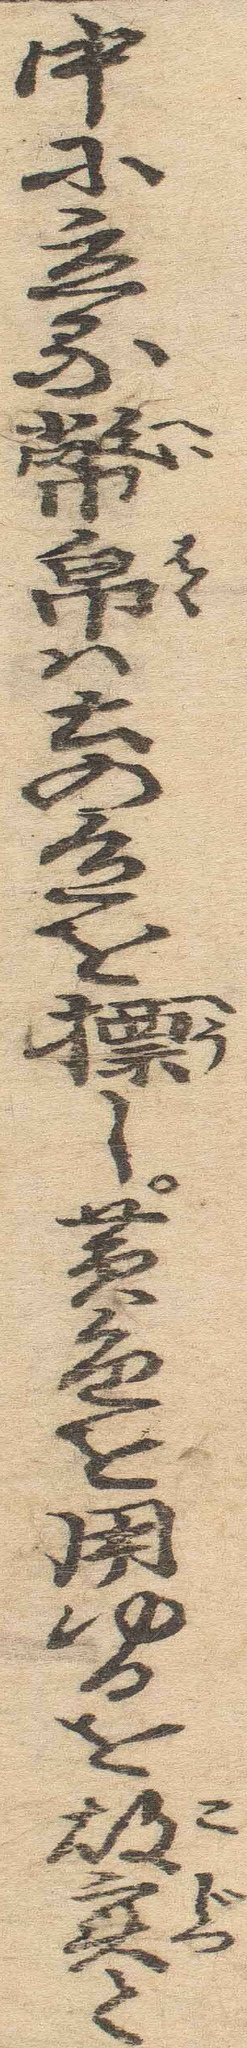中に立る幣帛は土の色を標し。黄色を用ゆるを故実と
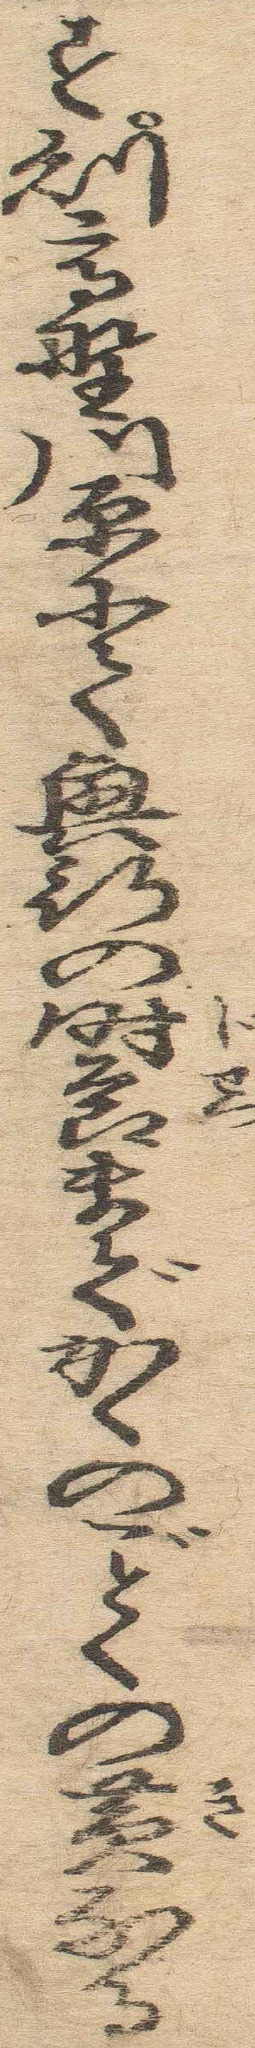す。則高野川原にて興行の時節までかくのごとくの黄なる
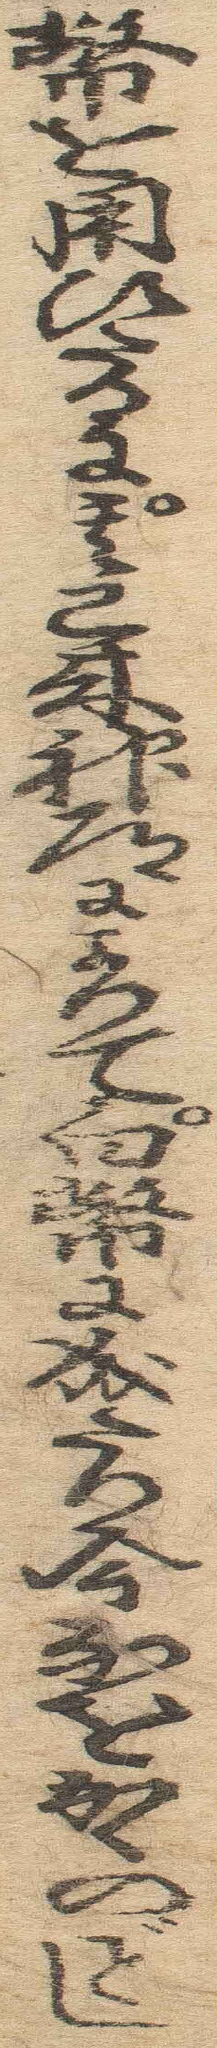幣を用ひたるに。其已来神道によつて。白幣に成たり今なをかくのごとし
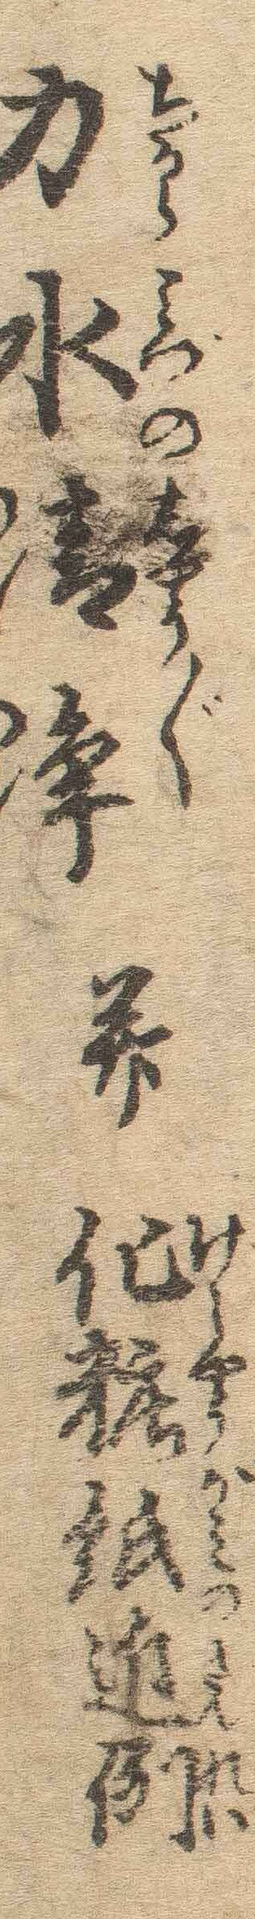力水清浄并化粧紙近例
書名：古今相撲大全
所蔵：東京学芸大学附属図書館 国文学研究資料館
